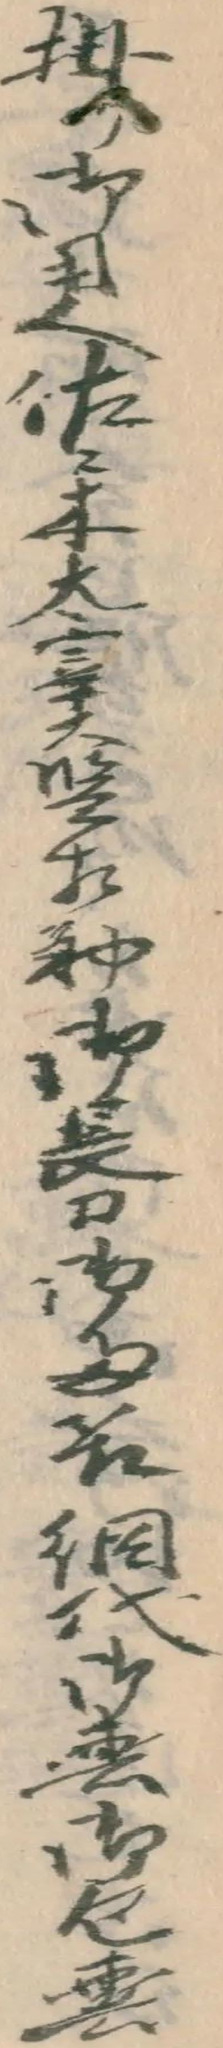掛り御用人佐々木大宰大監相勤御長刀御多節網代御輿御包輿
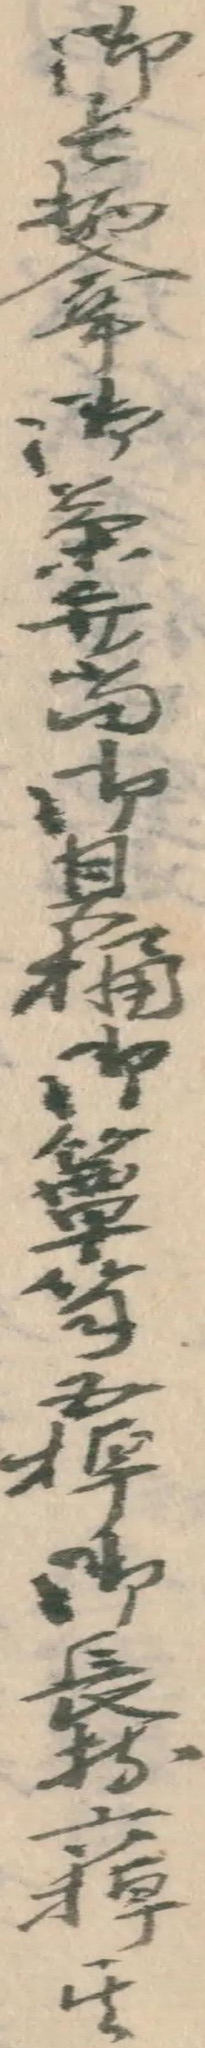御長柄傘御茶弁當御貝桶御箪笥五棹御長持六棹其
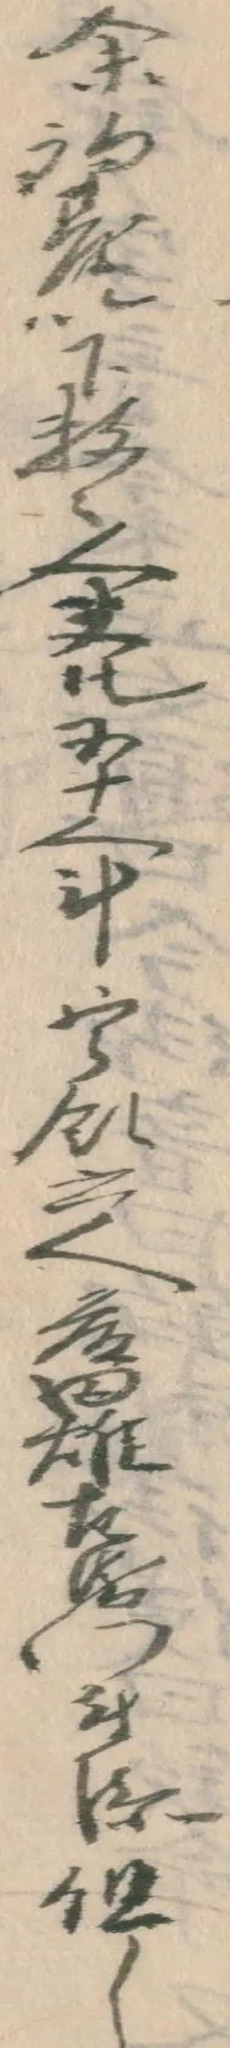余釣臺以下数々人夫共五十人斗宇領六人藤田雄左衛門尉添但し
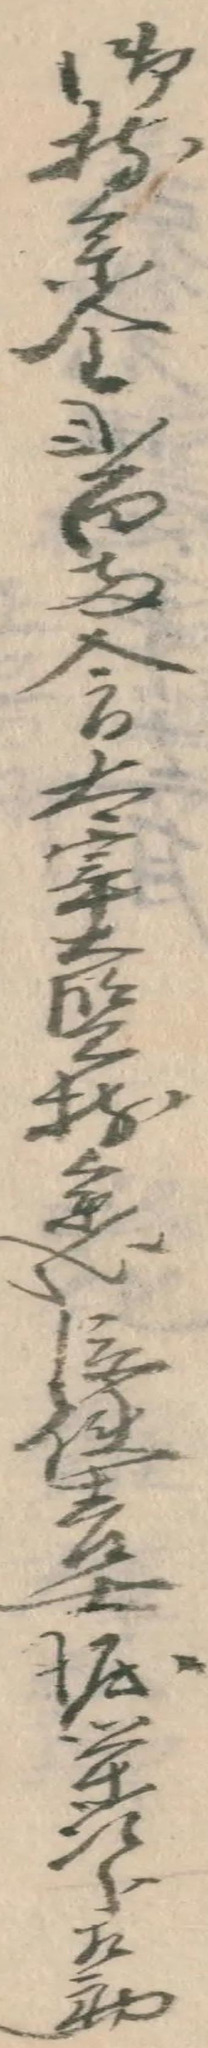御持参金弐百両今日太宰大監持参哉添使青士堀栄次郎相勤
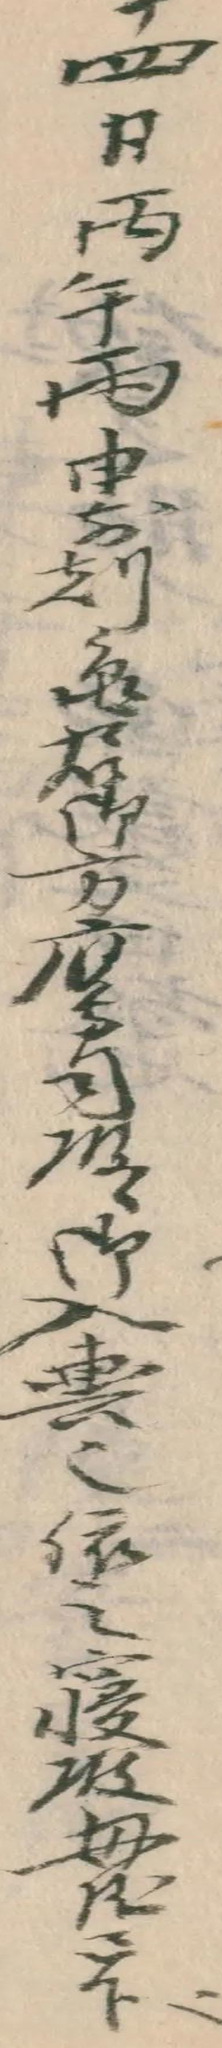十四日丙午雨申前刻亀君御方鷹司殿へ御入輿也依之寝殿母儀被下
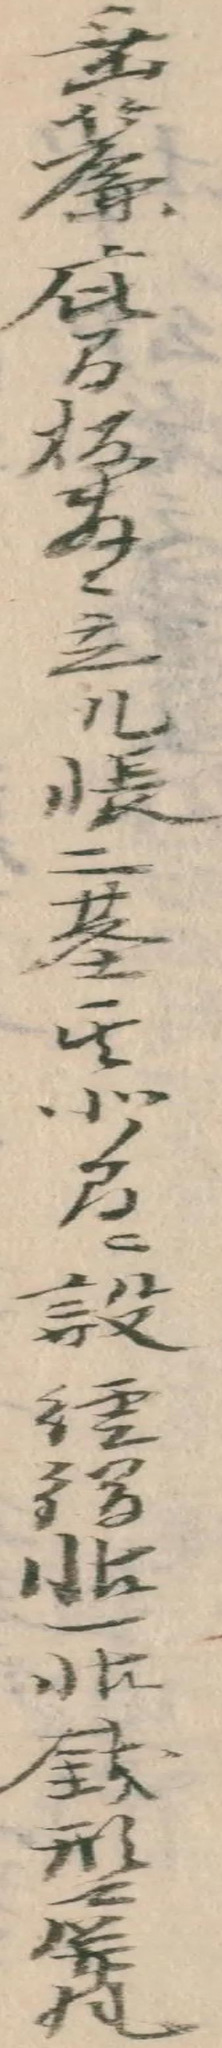垂簾庇間板敷ニ立几帳二基其北ノ間ニ設繧繝帖一帖銭形屏几
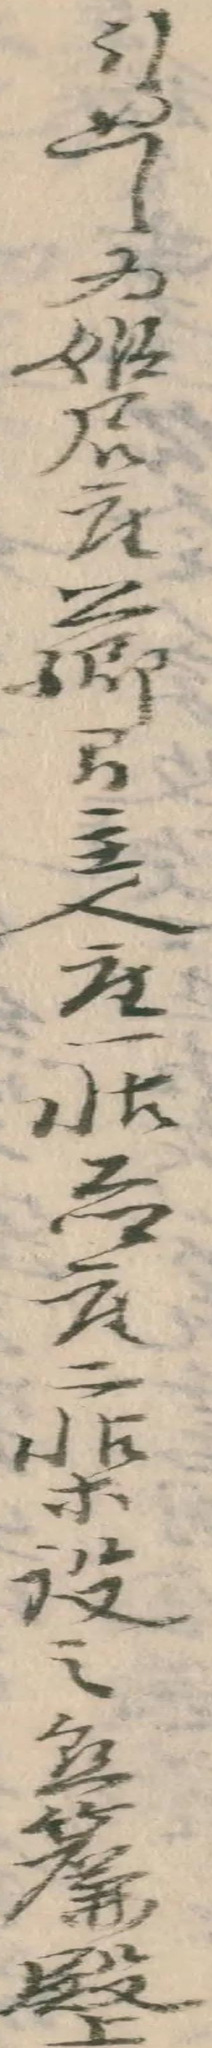引廻し為姫君座公卿間主人座一帖土間座二帖等設之懸簾殿上
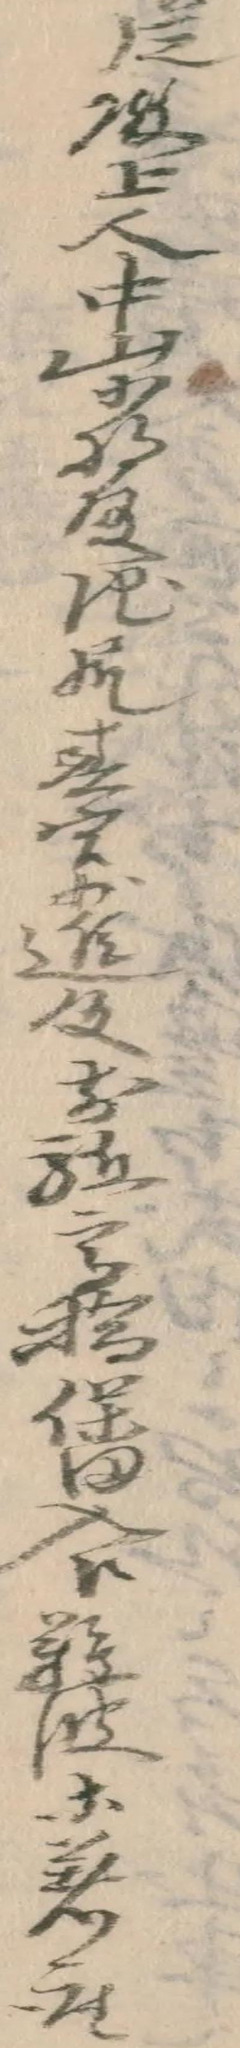従殿上人中山小将殿池尻春宮少進殿前駈高橋保田入江難波等着座
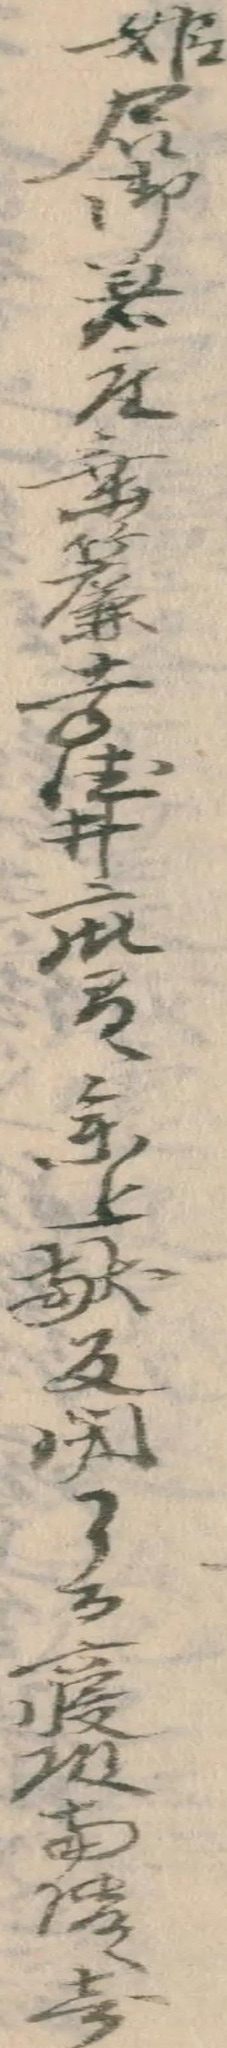姫君御着座垂簾幸徳井庇間へ参上献反閉了而寝殿南隅へ寄
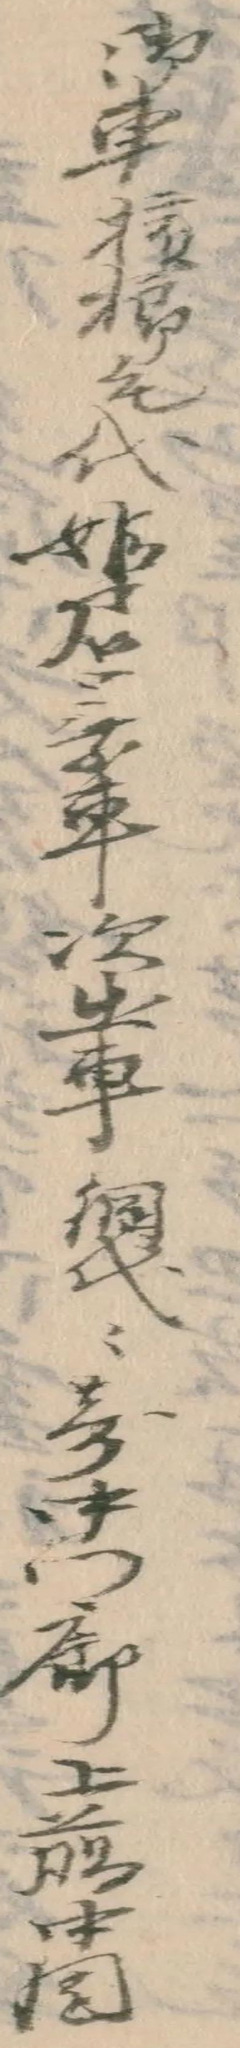御車檳櫛毛代姫君乗車次出車網代々寄中門廊上前中同
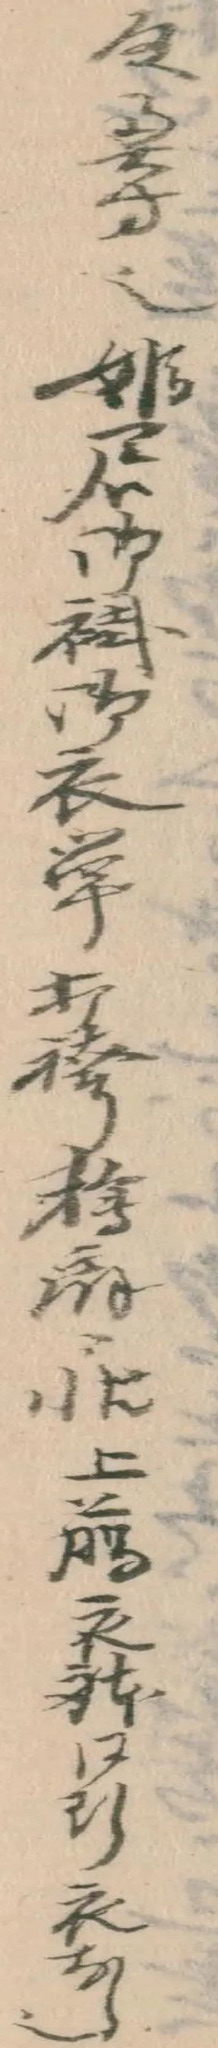殿奥方也姫君御褂御衣単打袴檜扇御帖上臈衣体同断衣なし
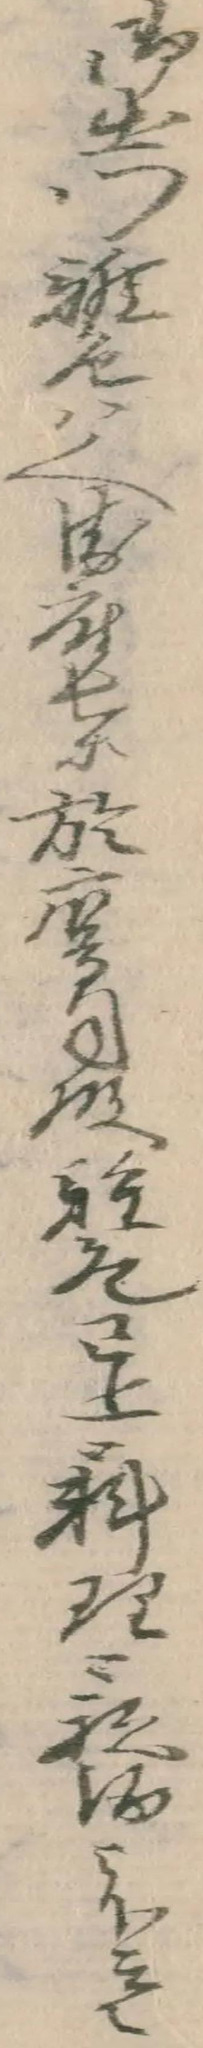御出門雑色八人衛府長に於鷹司殿雑色已上御料理御祝酒被下云々
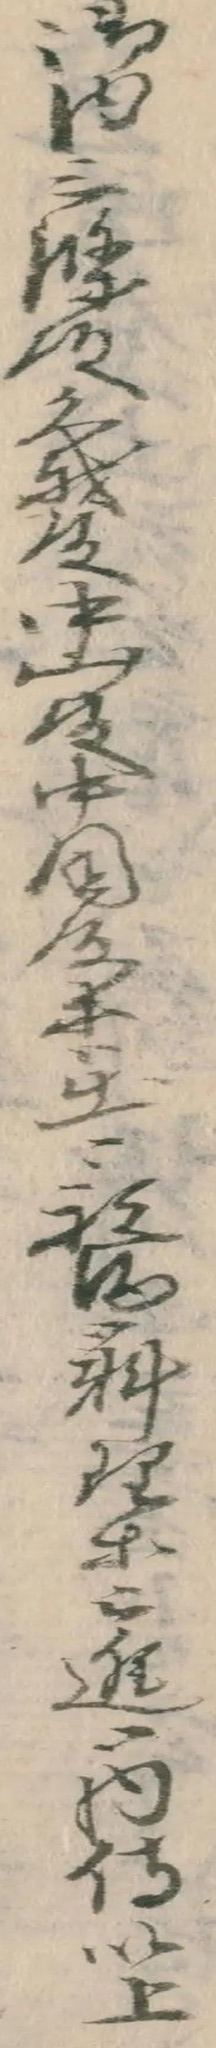御内三條殿久我殿中山殿中国殿等御出御祝酒料理等被進候内侍以上
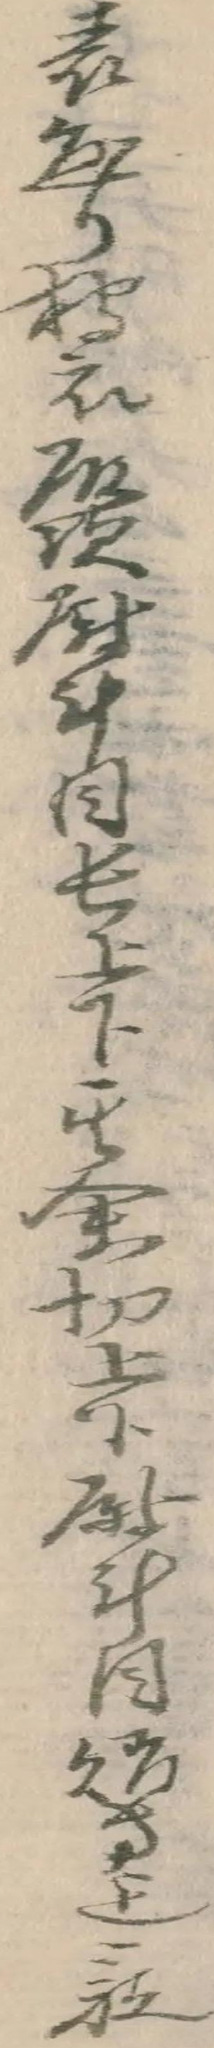表懸り狩衣取次尉斗目長上下其余切上下熨斗目賄方迄御祝
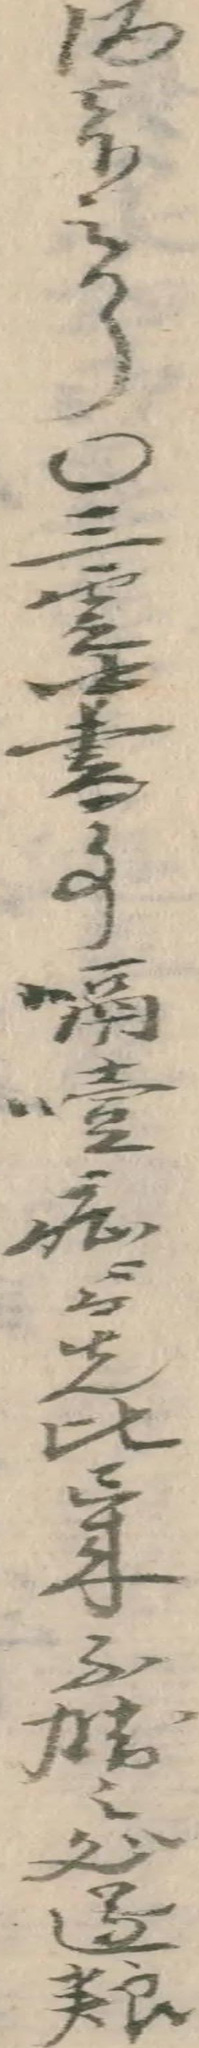酒被下之了〇三雲中書事嗝噎病二而先比已来不勝之処遂養
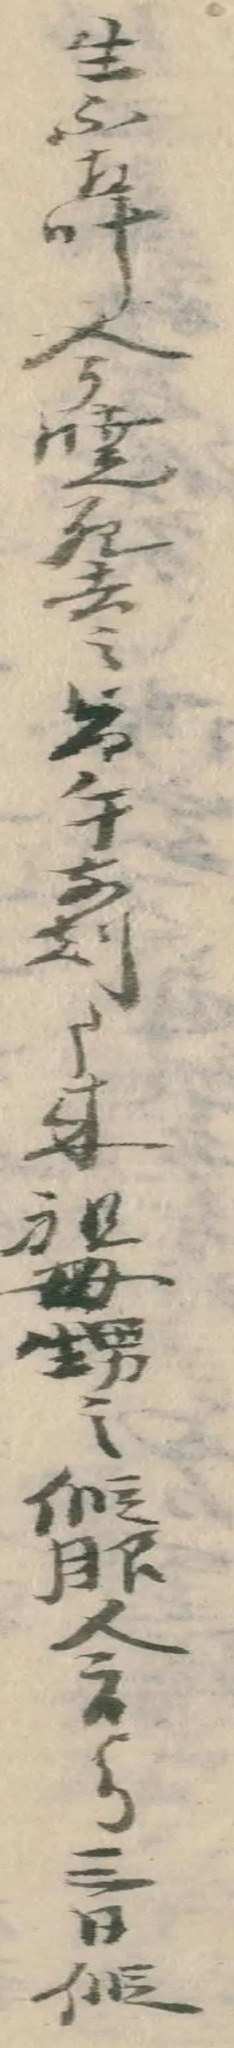生不相叶今暁死去之旨午前刻申来祖母甥之假服今日より三日假
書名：賀茂社記録. 第69冊
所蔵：国立国会図書館 National Diet Library, JAPAN
